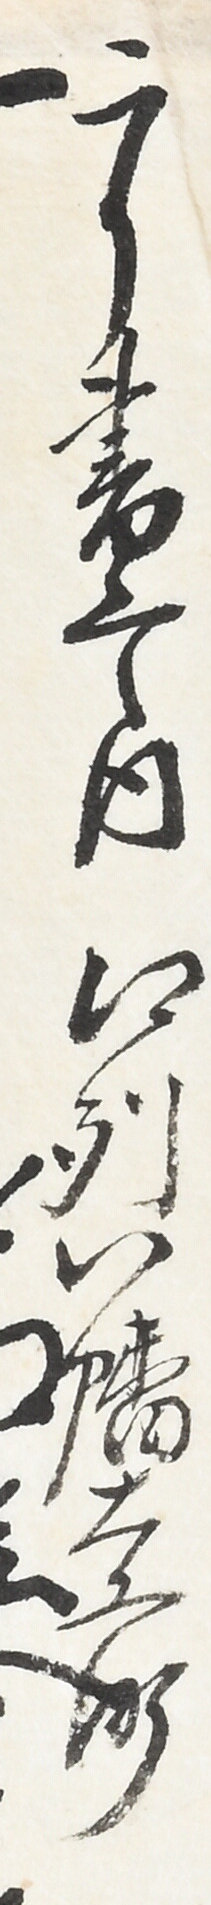二月書上之内江州八幡大工町
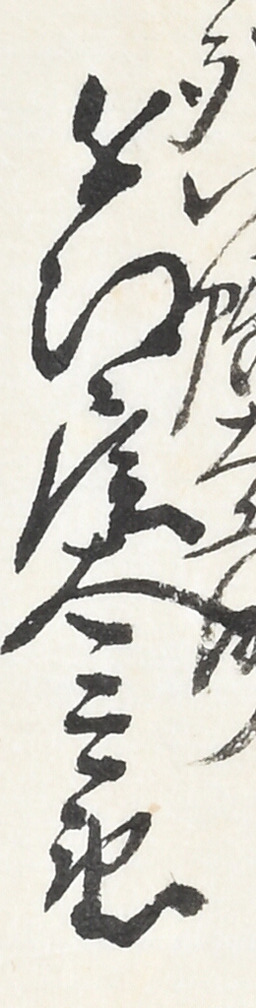近江屋太兵衛
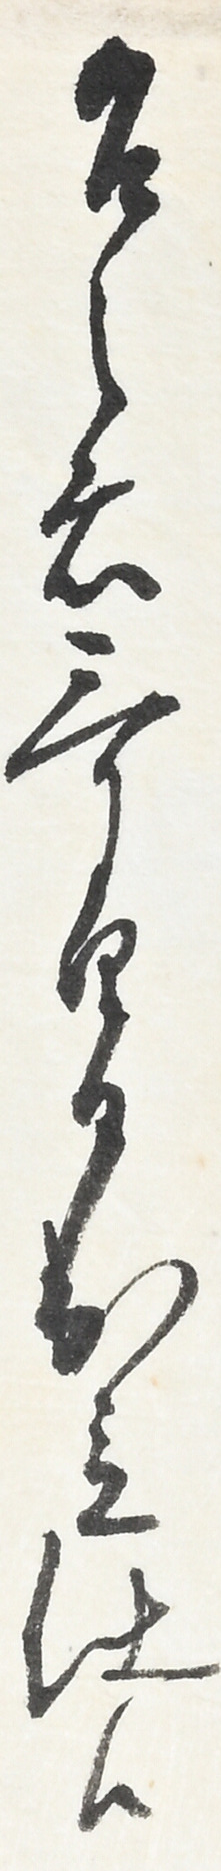右之者三月四日出立仕候
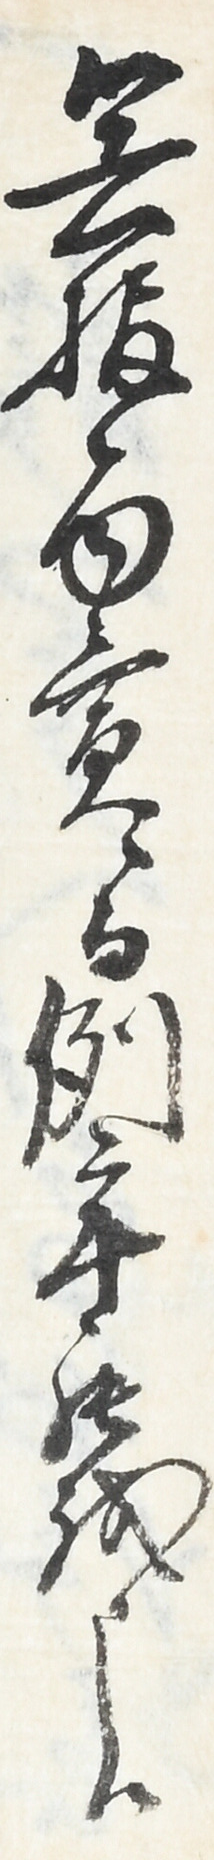植木商売ニ而例年罷越申候

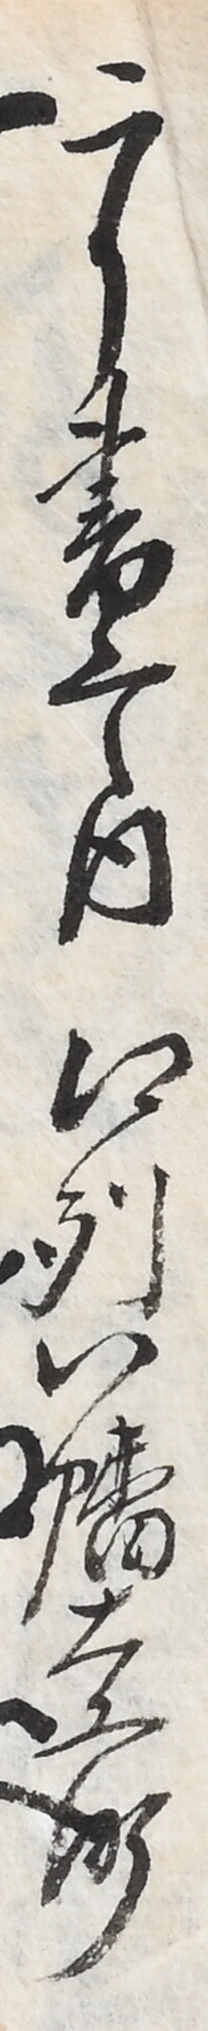二月書上之内江州神崎郡
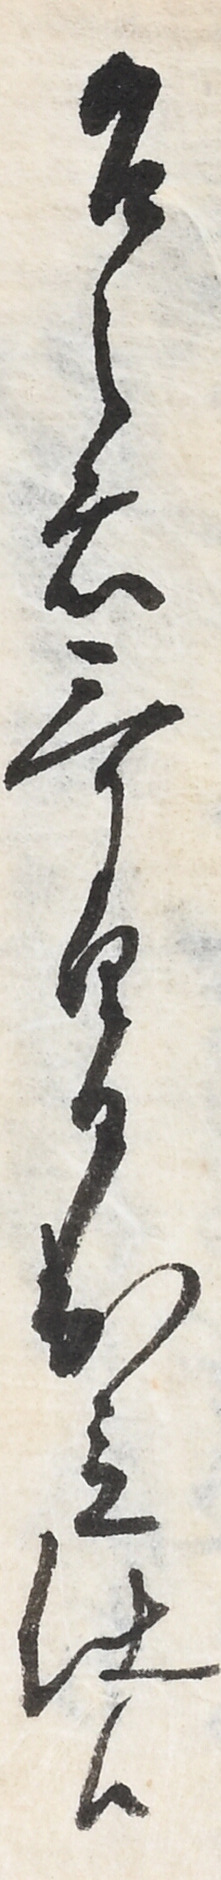右之者三月七日出立仕候
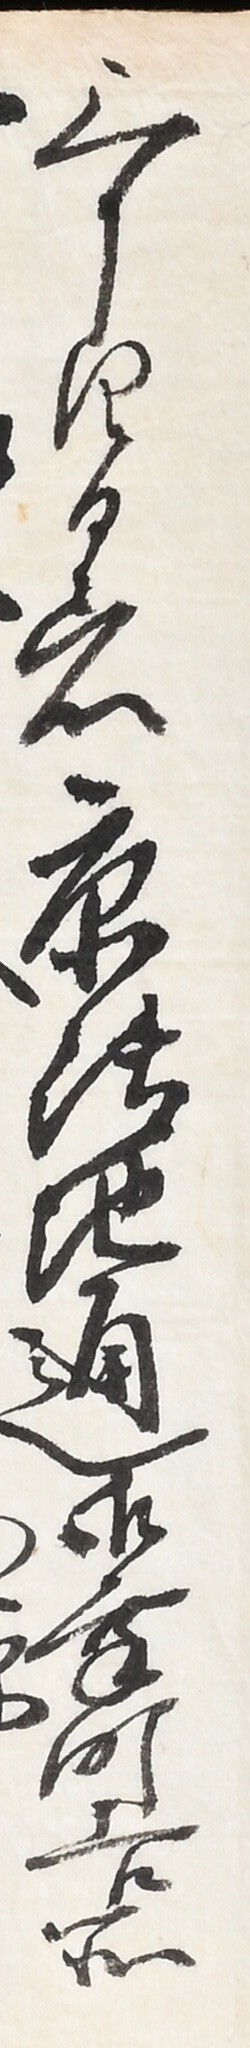三月四日着京御池通御幸町上ル所
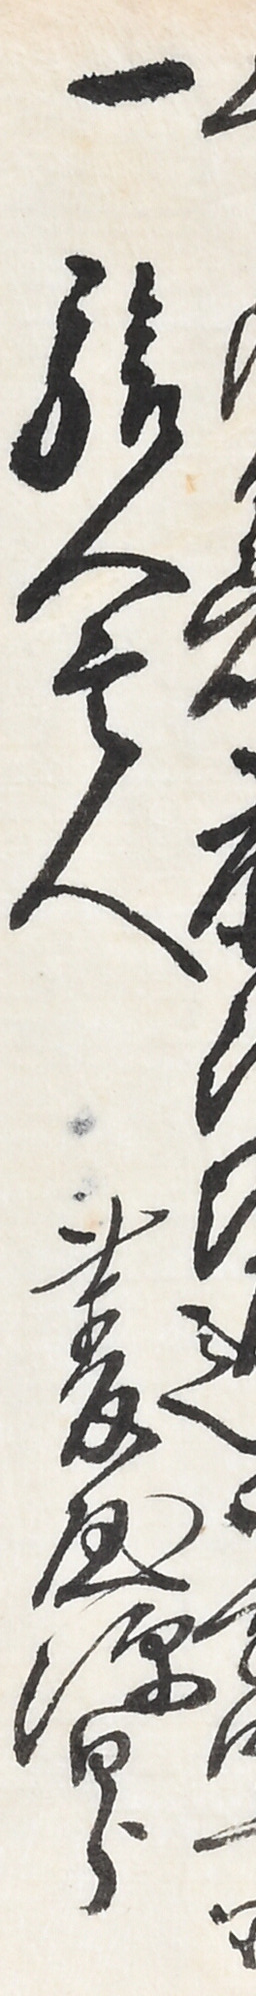一旅人壱人菱屋源四郎
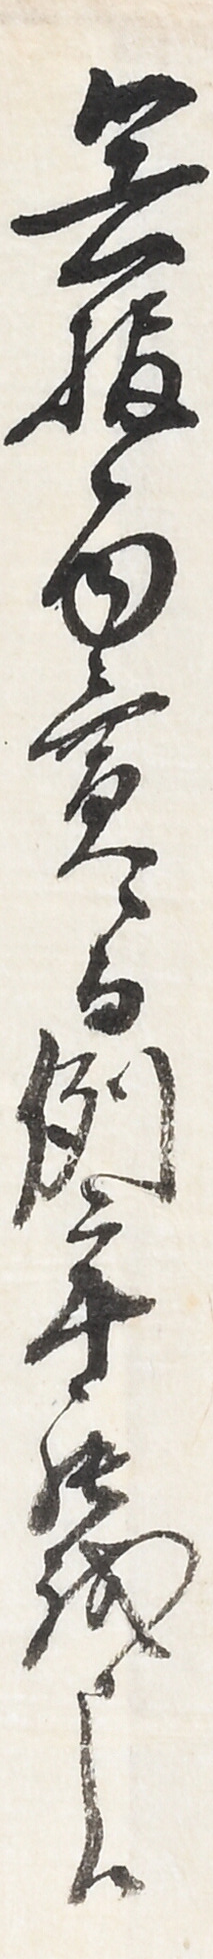呉服商売ニ而例年罷越申候
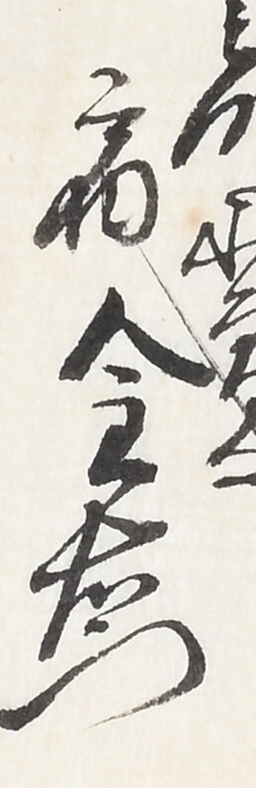宿金右衛門
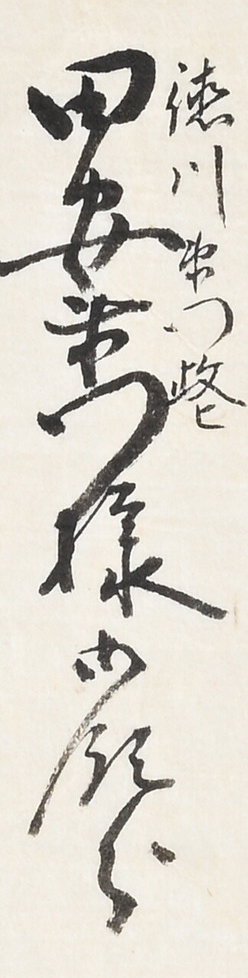田安衛門様御領分
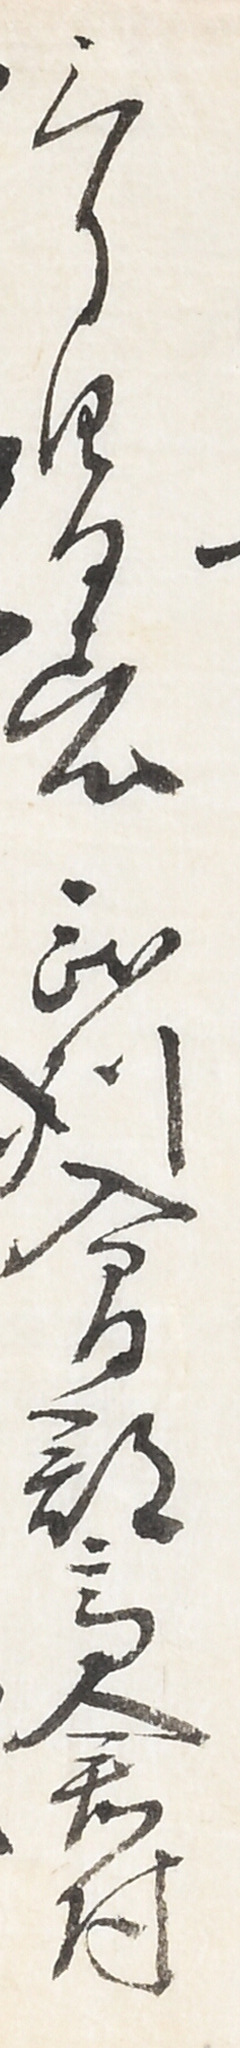参月四日着武州入間郡高倉村
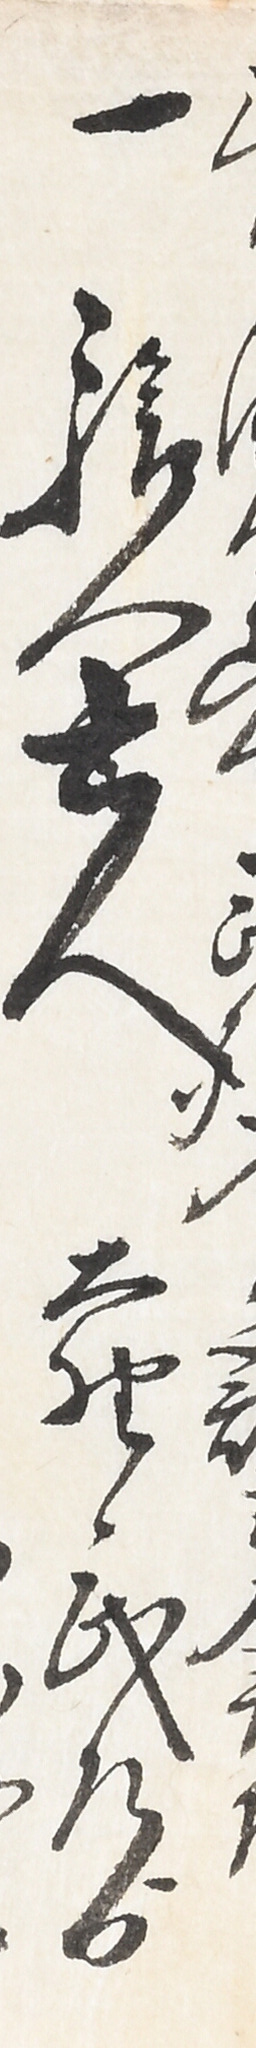一旅人六人大野々武左衛門
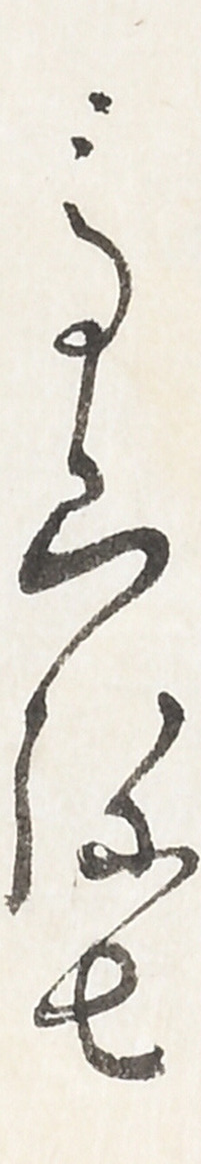高山弥七
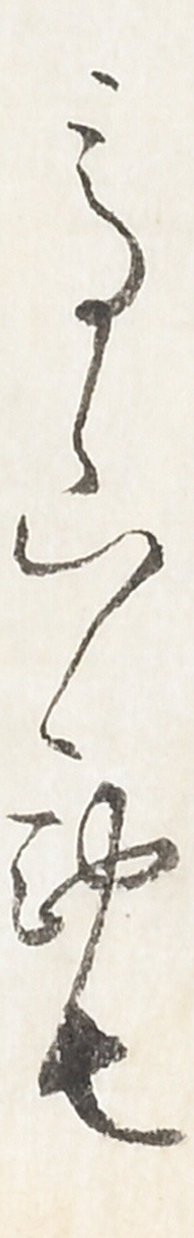高山勘七
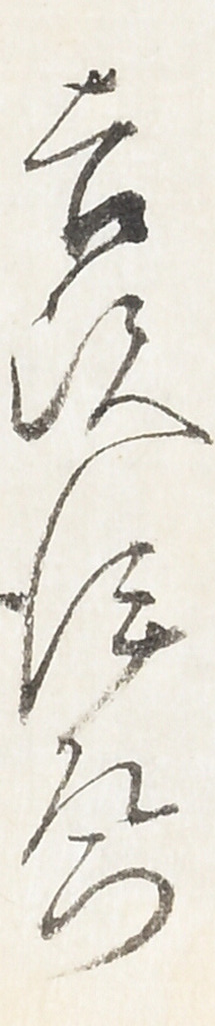吉沢伊左衛門
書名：旅人泊控帳
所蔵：伊那市立高遠町図書館・合同会社AMANE
